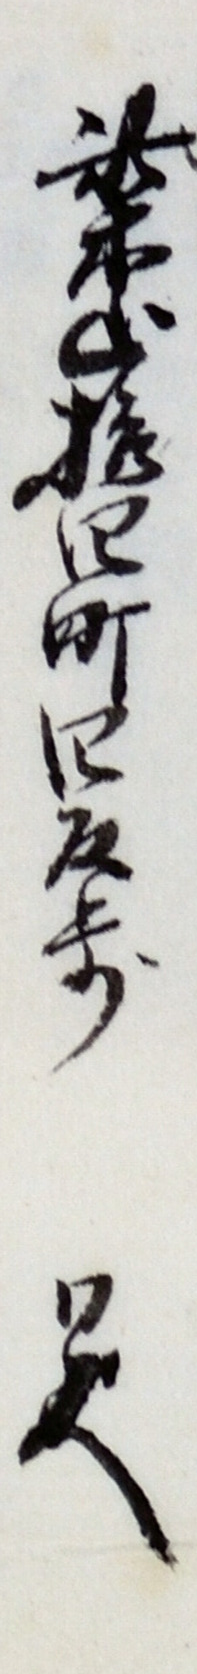柴山拾四町四反歩同人
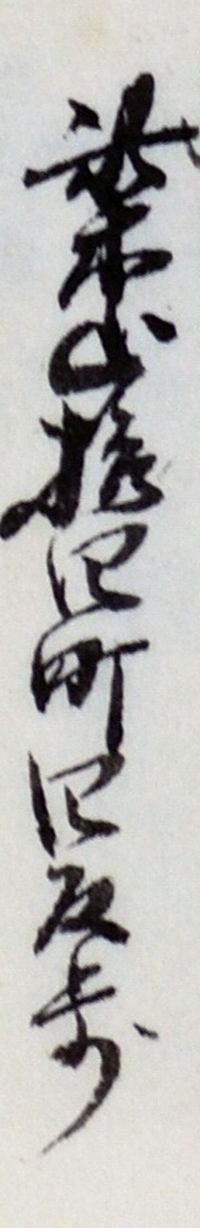柴山拾四町四反歩同人
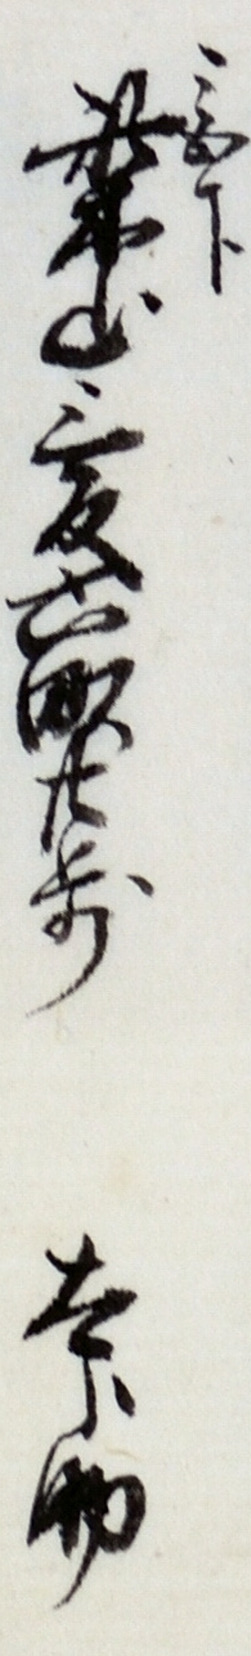柴山三反六畝廿歩太郎助
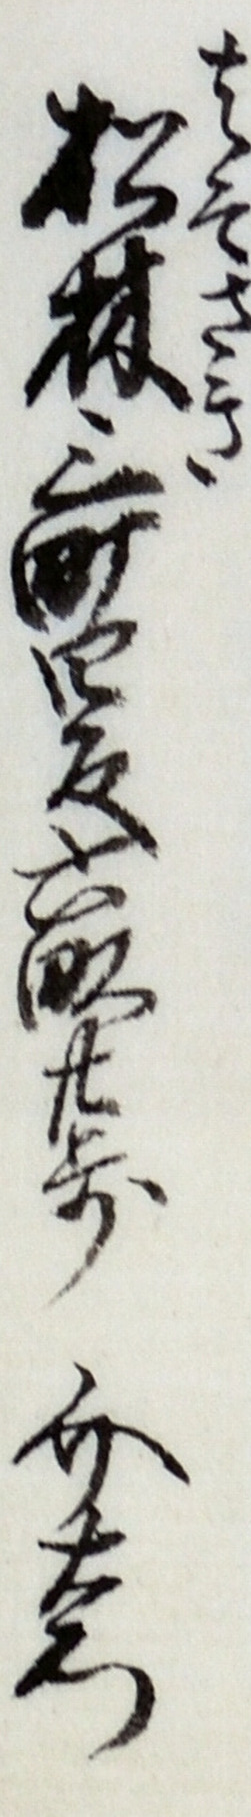松林三町四反六畝廿歩介右衛門
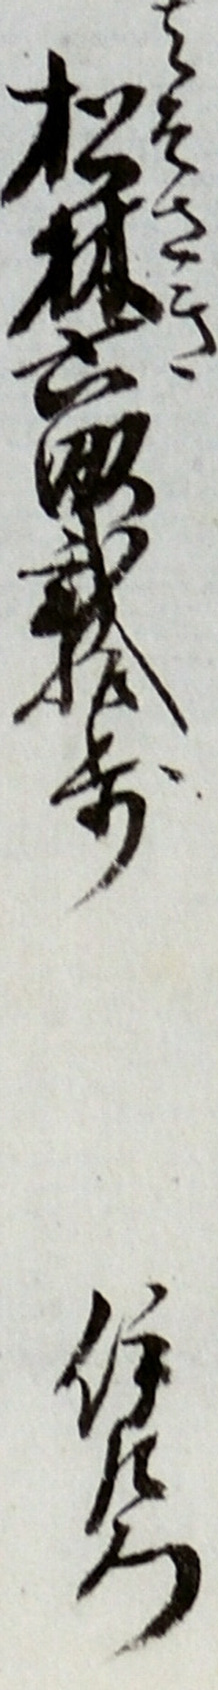松林六畝弐拾歩伊左衛門
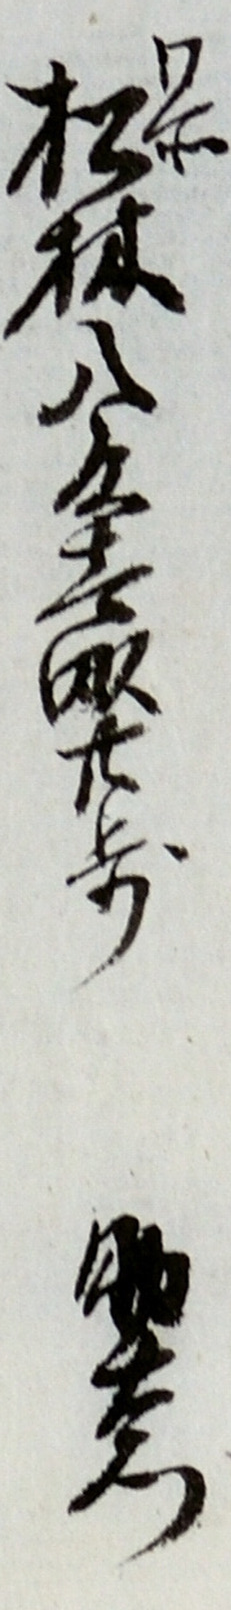松林八反壱畝廿歩助右衛門

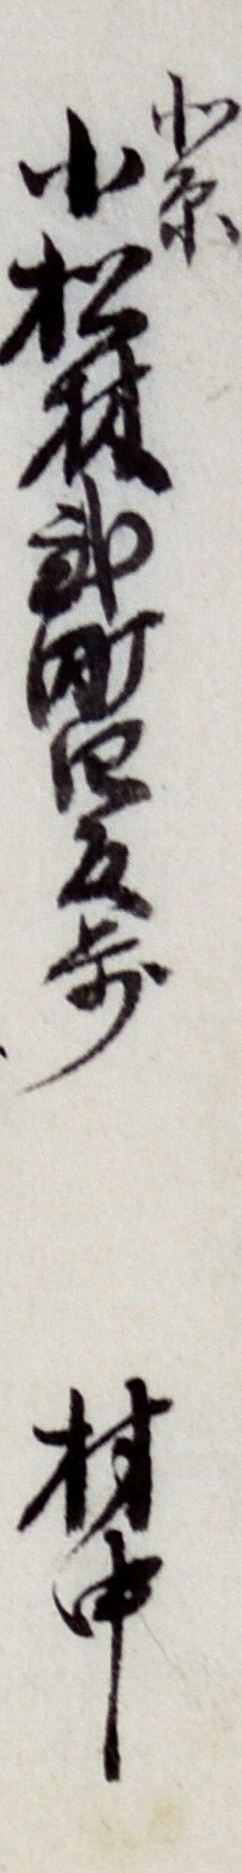小松林弐町四反歩村中
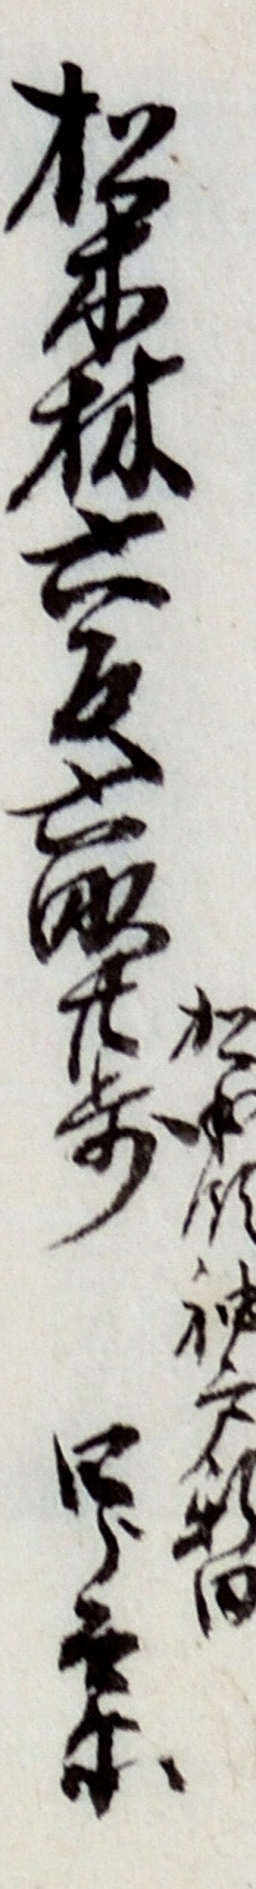松木林六反六畝歩四郎兵衛
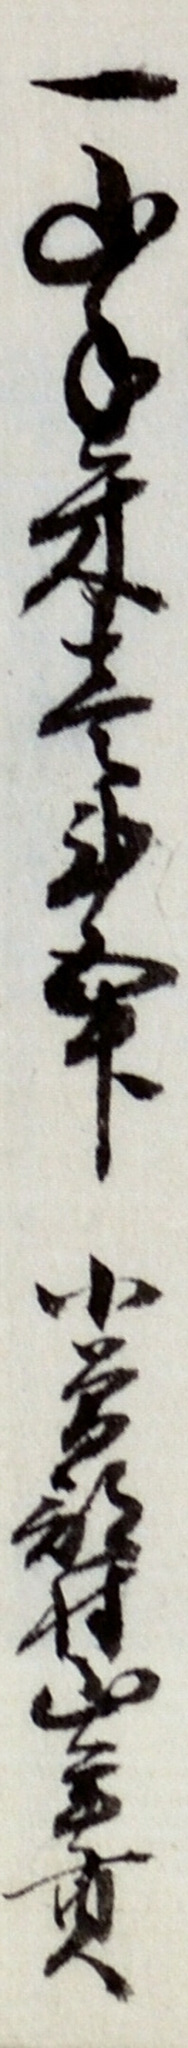一山手米壱斗五升小曾部村山年貢
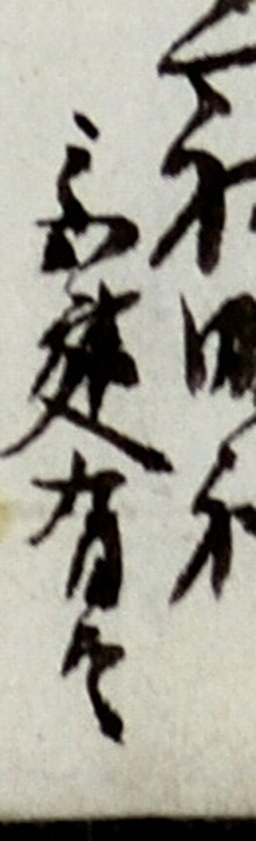宮建有之
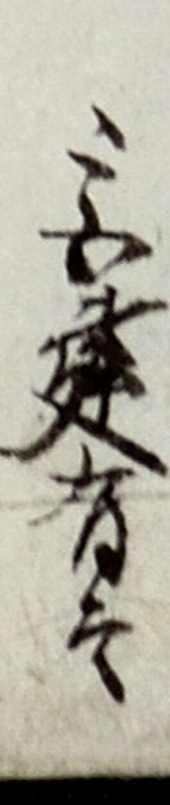宮建有之
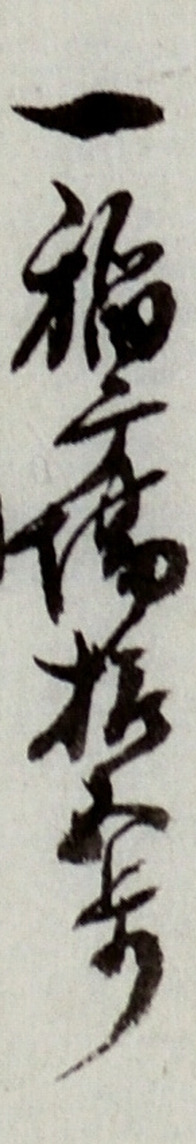一稲干場拾五歩

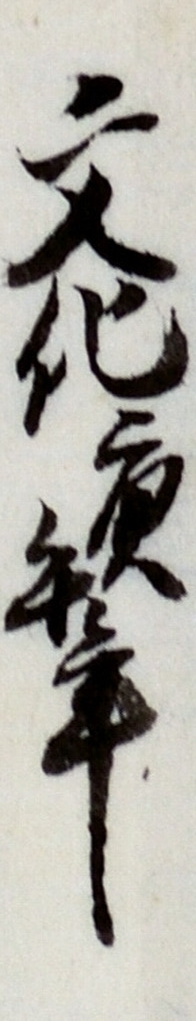文化庚午年
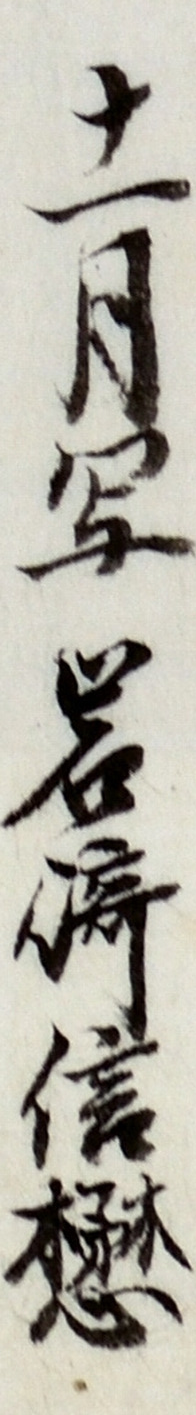十一月写岩崎信懋
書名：御領分中山林社地手控
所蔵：伊那市立高遠町図書館・合同会社AMANE
